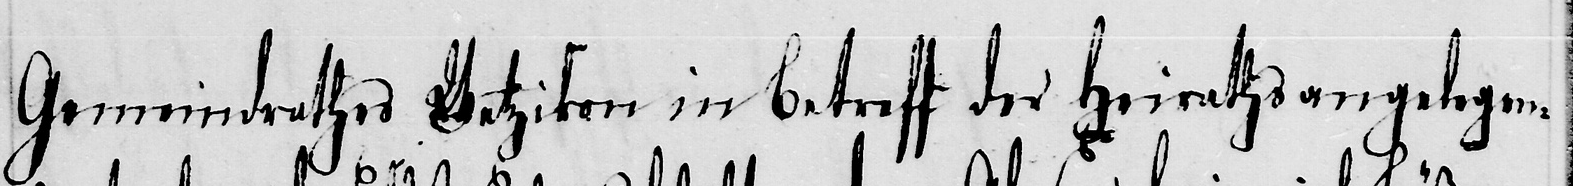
Gemeindrathes Wetzikon in Betreff der Heirathsangelegen¬
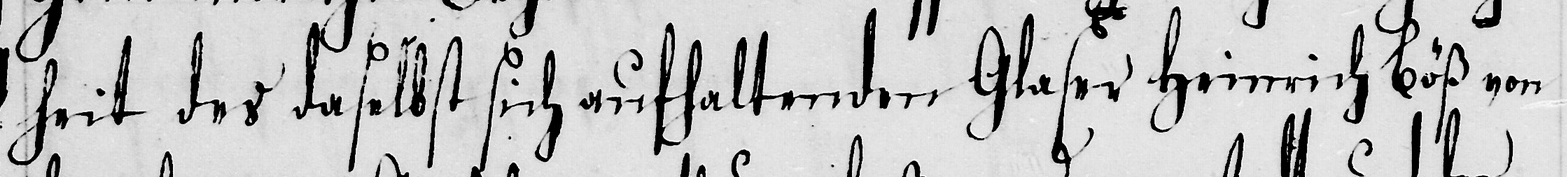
heit des daselbst sich aufhaltenden Glaser Heinrich Böß von
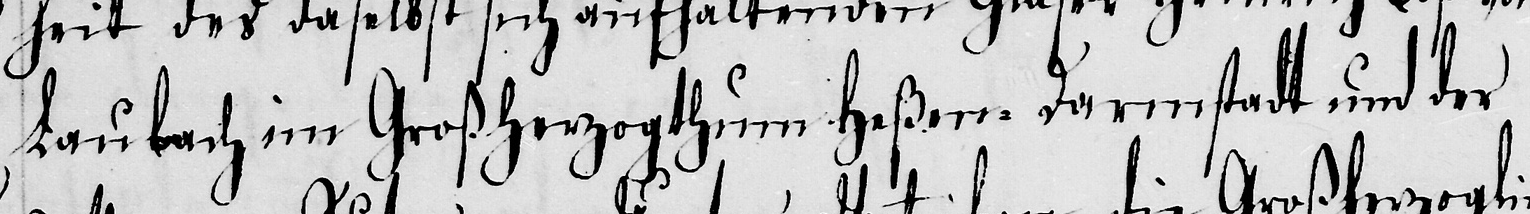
Laubach im Großherzogthum Heßen-Darmstadt und der
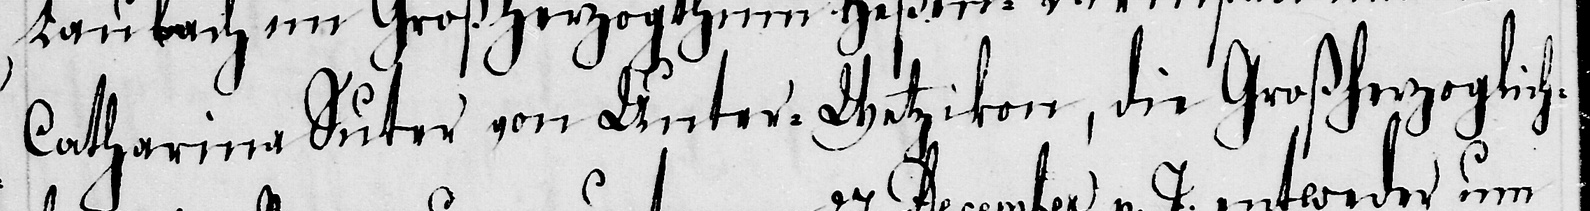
Catharina Suter von Unter-Wetzikon, die Großherzoglic¬
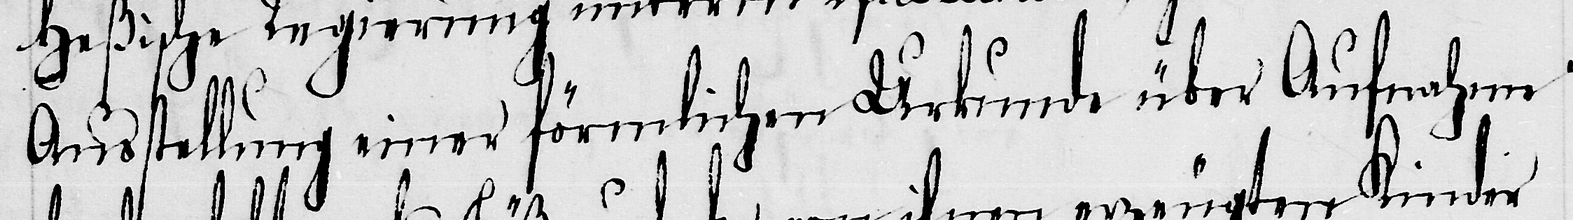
Ausstellung einer förmlichen Urkunde über Aufnahme
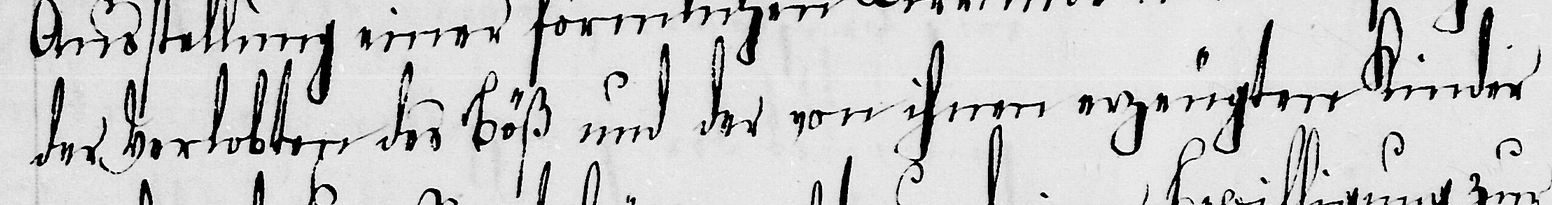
der Verlobten des Böß und von ihnen erzeugten Kinder
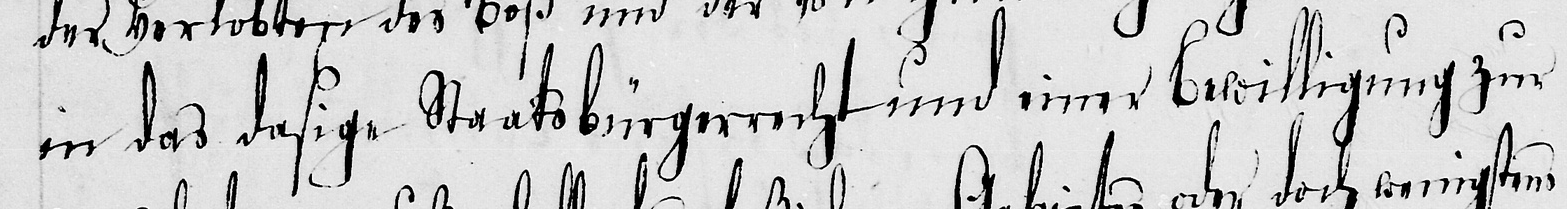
in das dasige Staatsbürgerrecht und einer Bewilligung zur
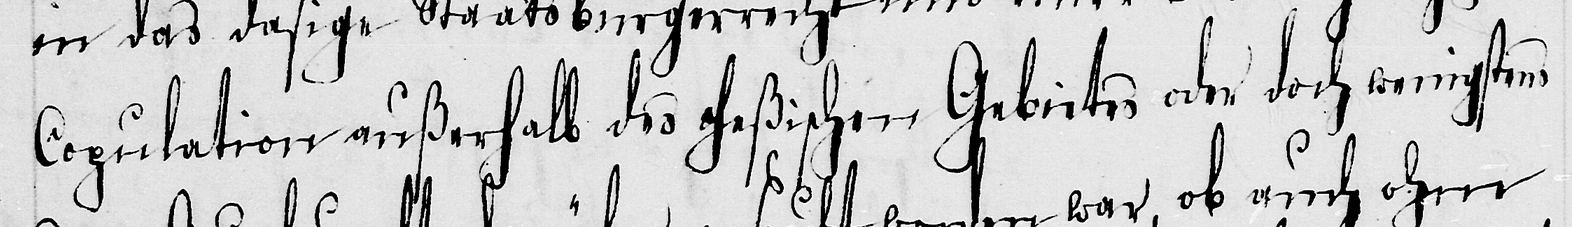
Copulation außerhalb des heßischen Gebietes oder doch wenigsten
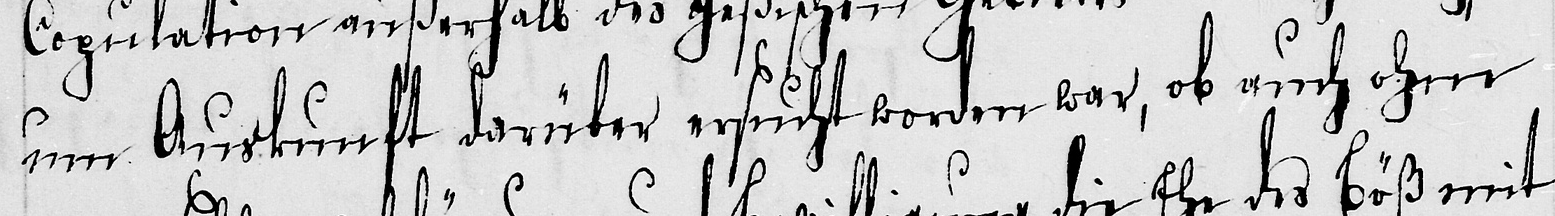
um Auskunft darüber ersucht worden war, ob auch ohne
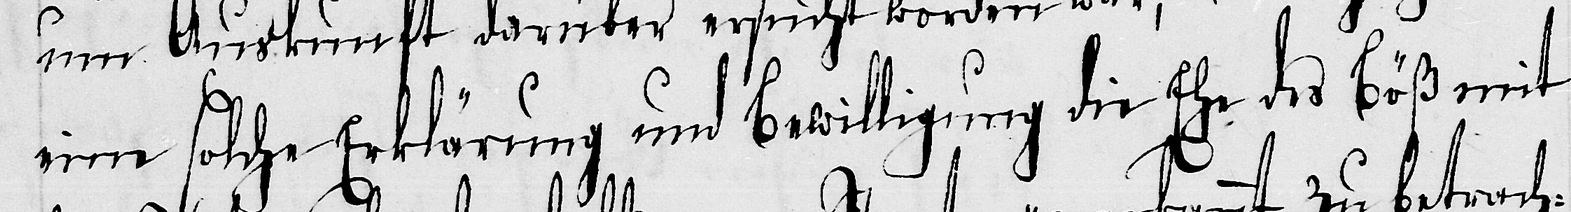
eine solche Erklärung und Bewilligung die Ehe des Böß mit
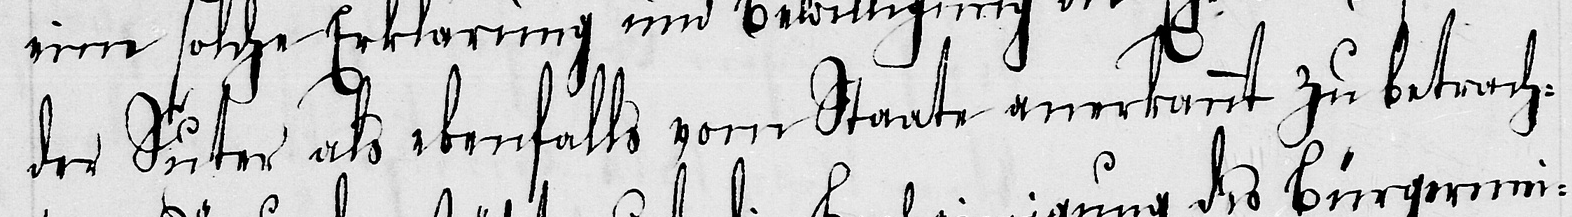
der Suter als ebenfalls vom Staate anerkannt zu betrach¬
